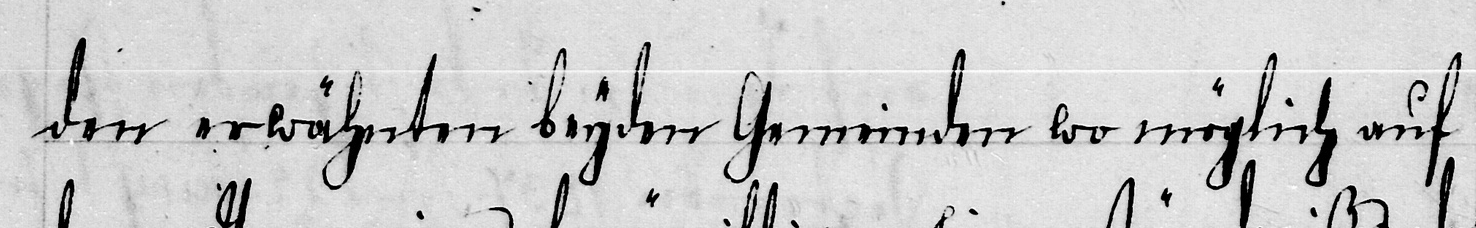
den erwähnten beyden Gemeinden wo möglich auf
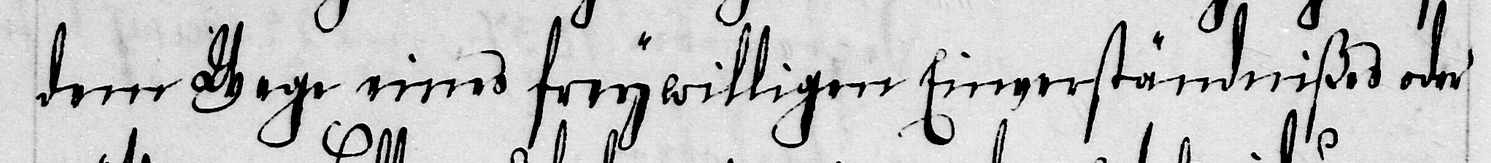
dem Wege eines freywilligen Einverständnißes oder
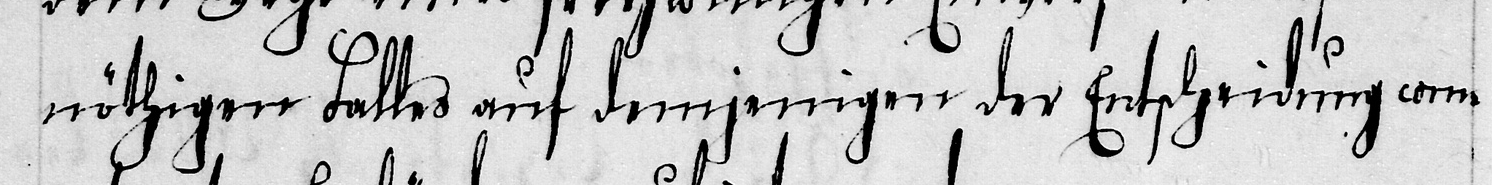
nöthigen Falles auf demjenigen der Entscheidung com¬
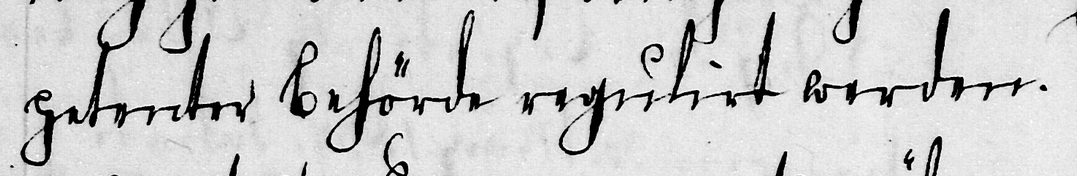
petenter Behörde regulirt werden.
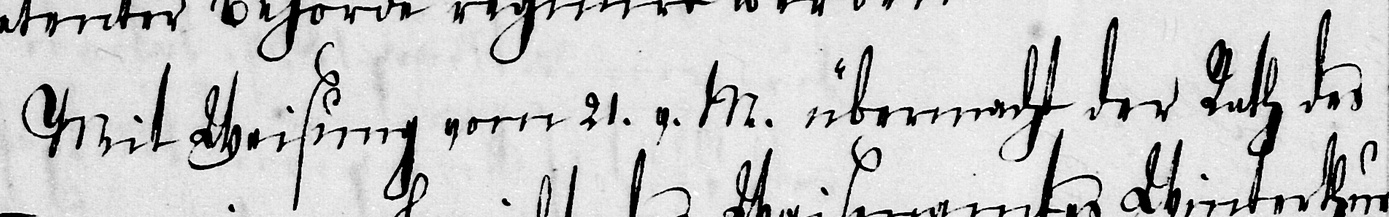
Mit Weisung vom 21. v. M. übermacht der Rath des
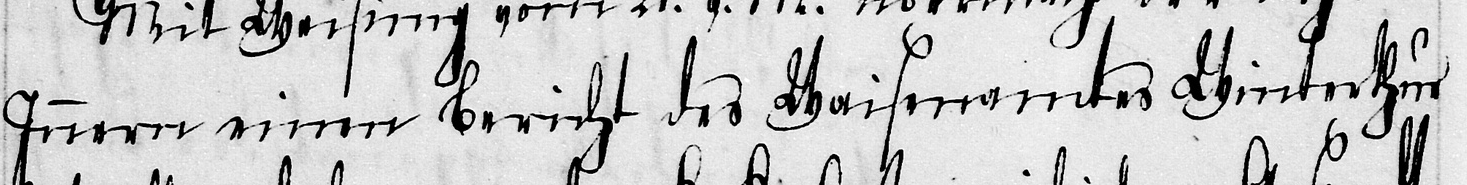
Innern einen Bericht des Waisenamtes Winterthur
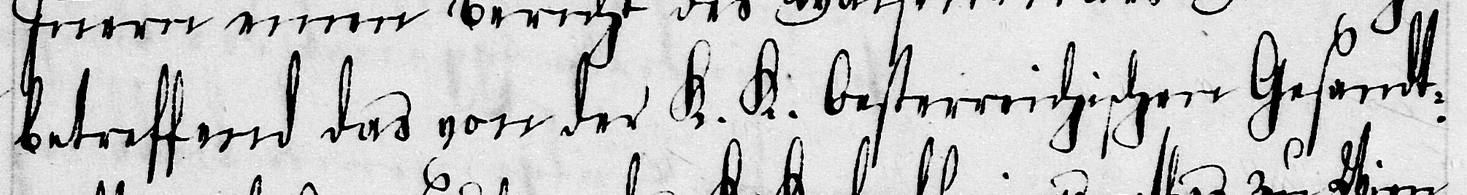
betreffend das von der K. K. Oesterreichischen Gesandt¬
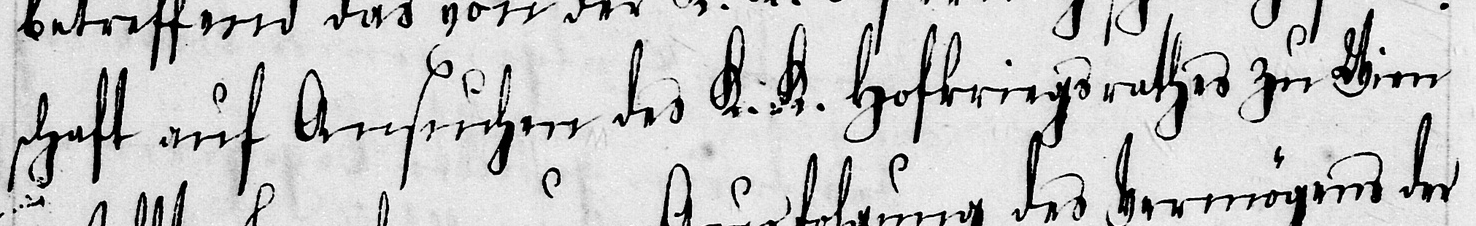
chaft auf Ansuchen des K. K. Hofkriegsrathes zu Wien
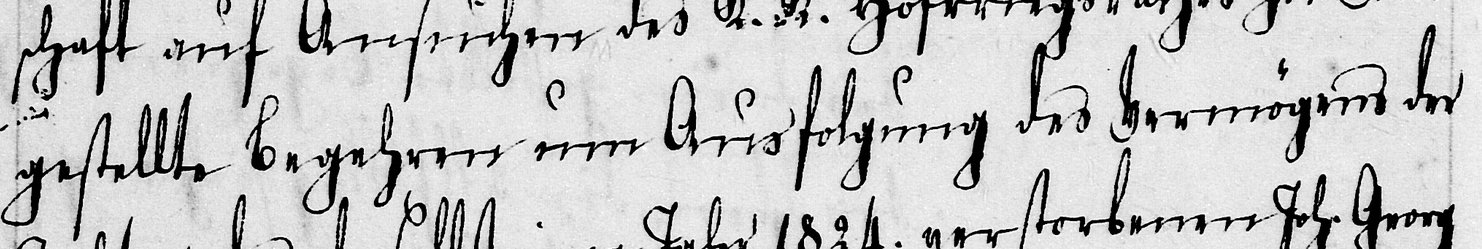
gestellte Begehren um Ausfolgung des Vermögens der
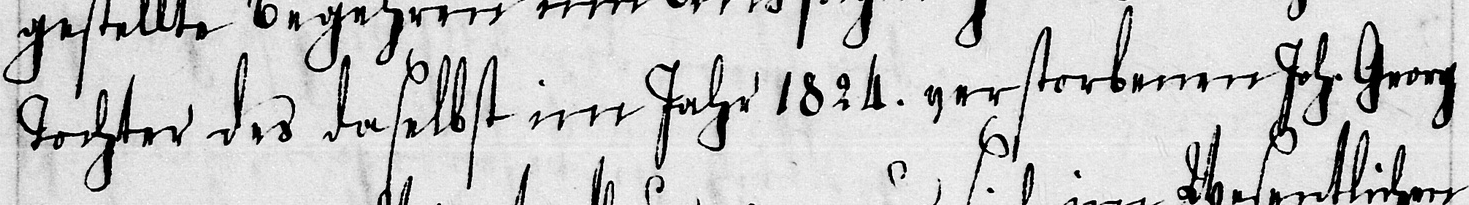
Tochter des daselbst im Jahr 1824. verstorbenen Joh. Georg
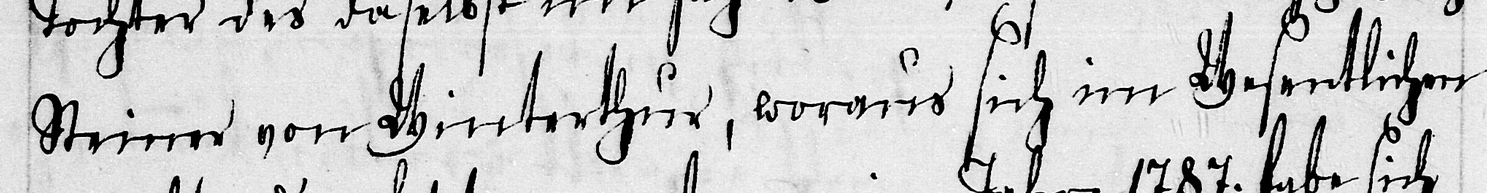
Steiner von Winterthur, woraus sich im Wesentlichen
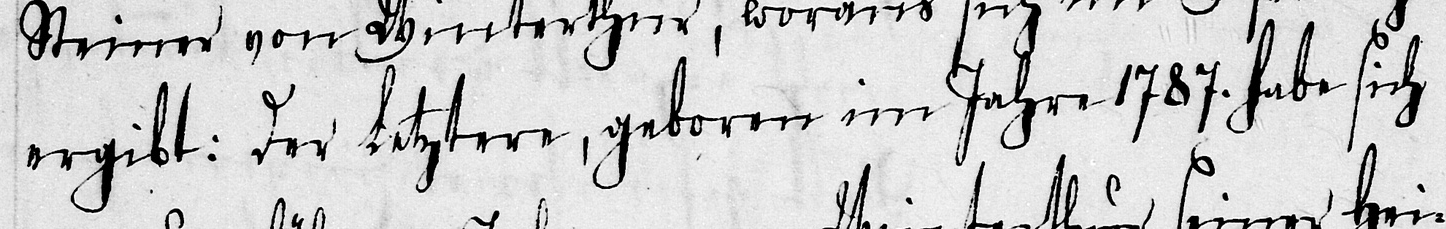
ergibt: Der Letztere, geboren im Jahre 1787. habe sich
